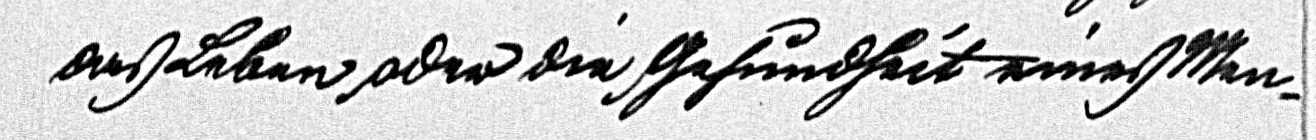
aus Leben oder die Gesundheit eines Men¬
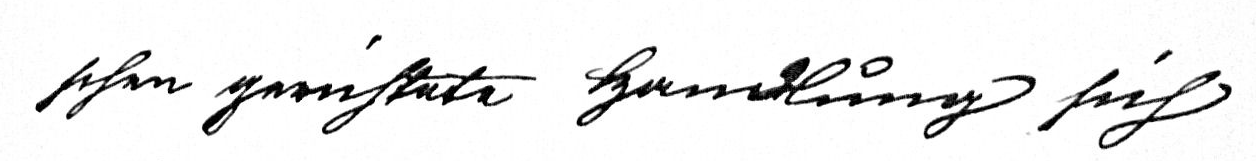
schen gerichtete Handlung sich
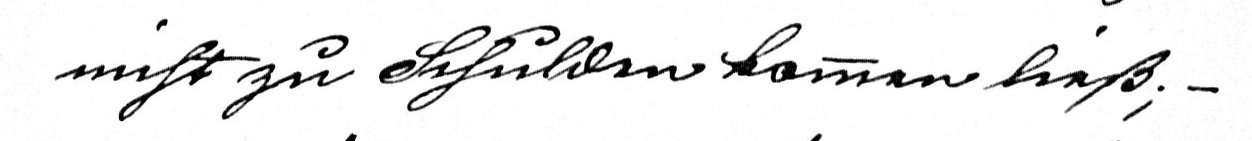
nicht zu Schulden kommen ließ; -
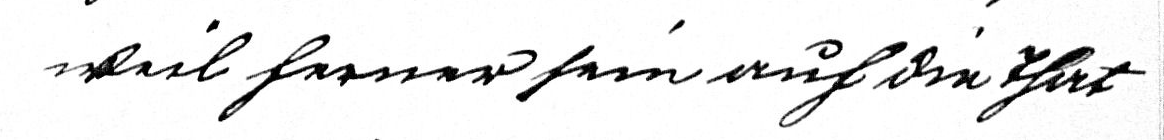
weil ferner sein auf die That
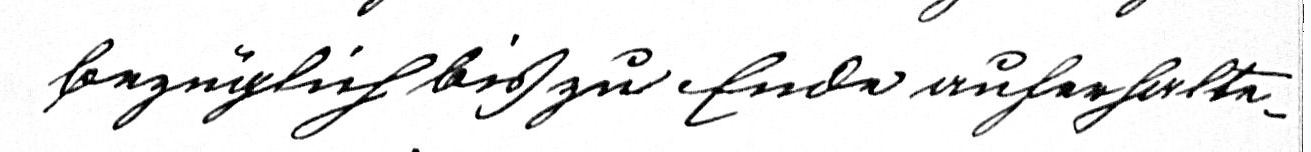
bezüglich bis zu Ende auferhalte¬
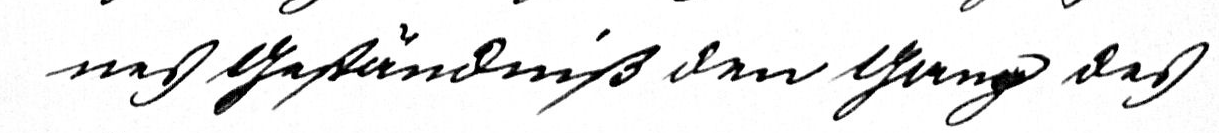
nes Geständniß den Gang des
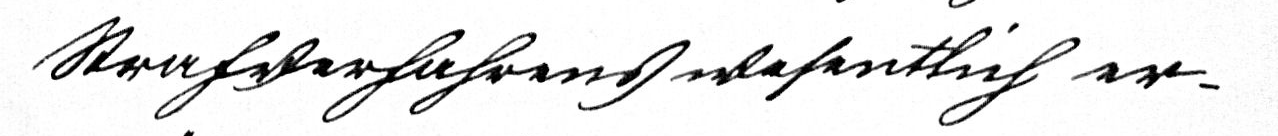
Strafverfahrens wesentlich er¬
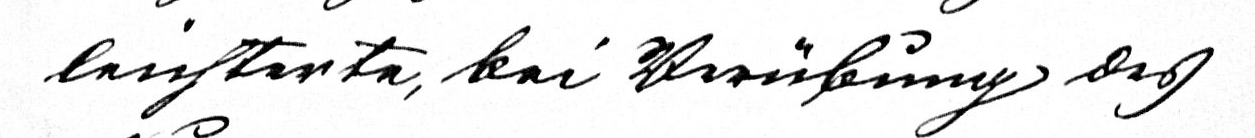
leichterte, bei Verübung des
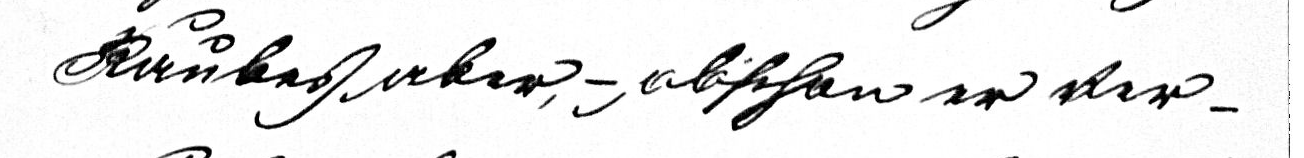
Raubes aber, - obschon er ver¬
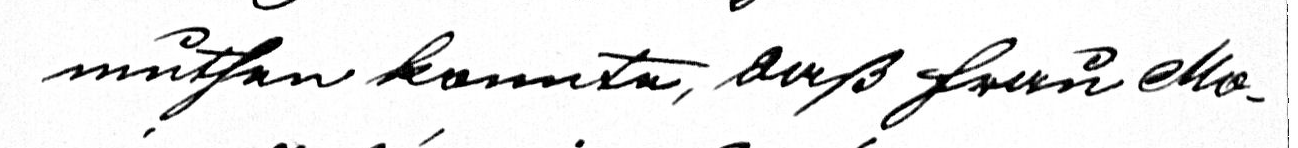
muthen konnte, daß frau Mo¬
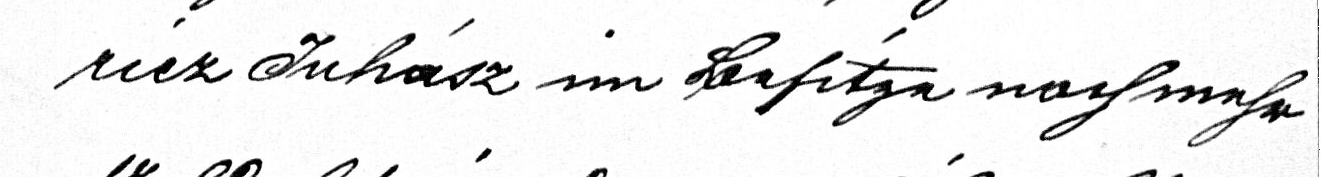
ricz Inhász im Besitze noch mehr
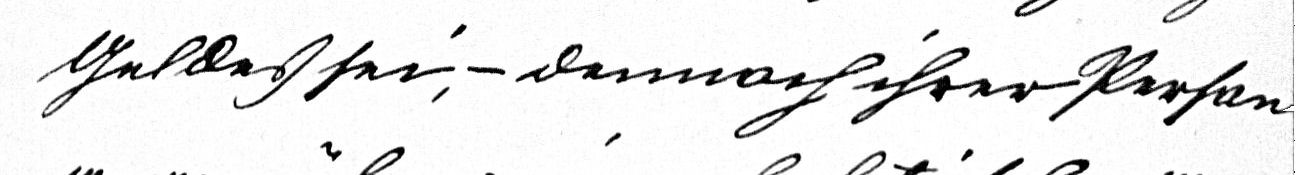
Geldes sei, - dennoch ihrer Person
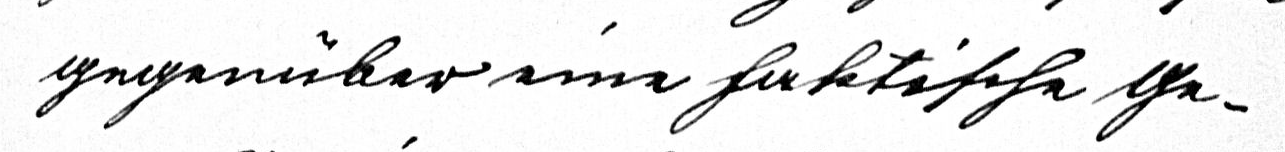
gegenüber eine faktische Ge¬
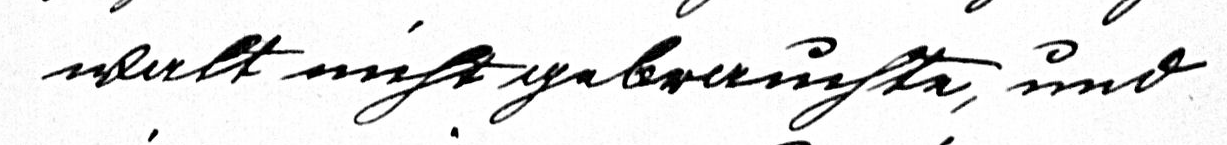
walt nicht gebrauchte, und
